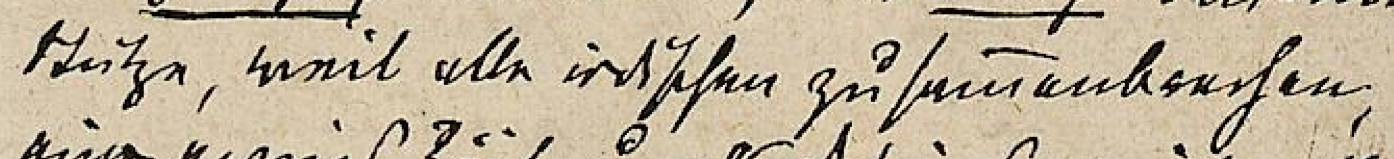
Stütze, weil alle irdischen zusamenbrechen,
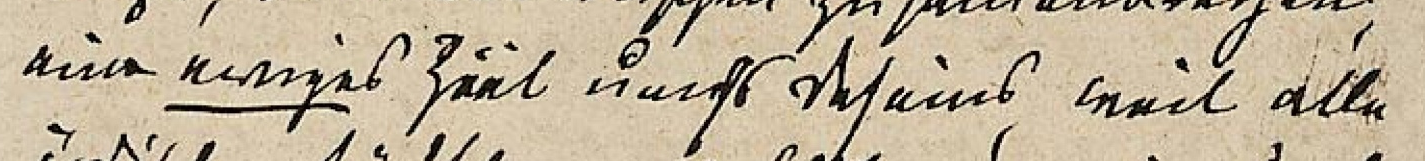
ein ewiges Ziel unss Daseins, weil alle
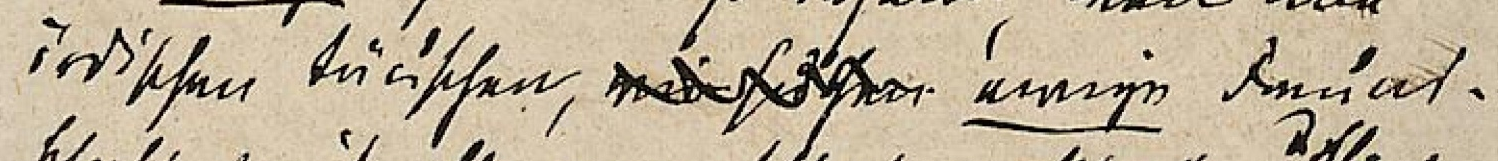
irdischen täuschen, wir suchen ewige Freund¬
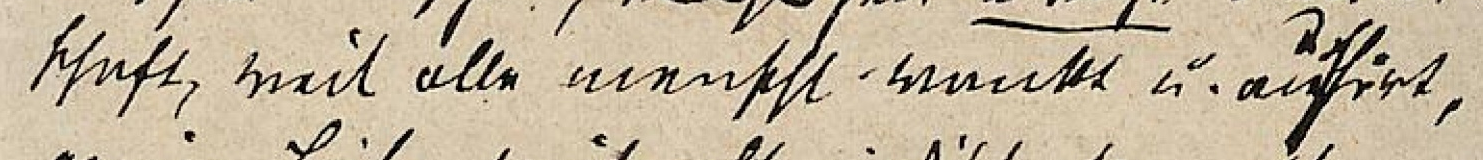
schaft, weil alle menschl wankt u. aufhört,
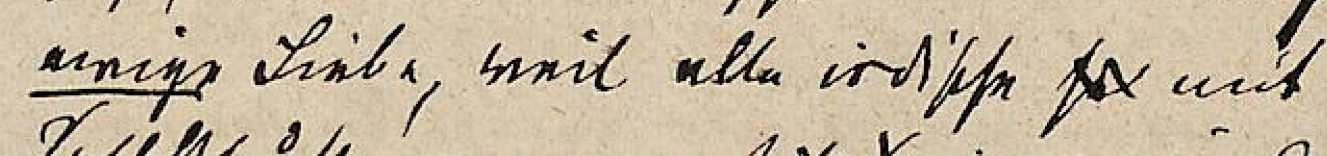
ewige Liebe, weil alle irdische so mit
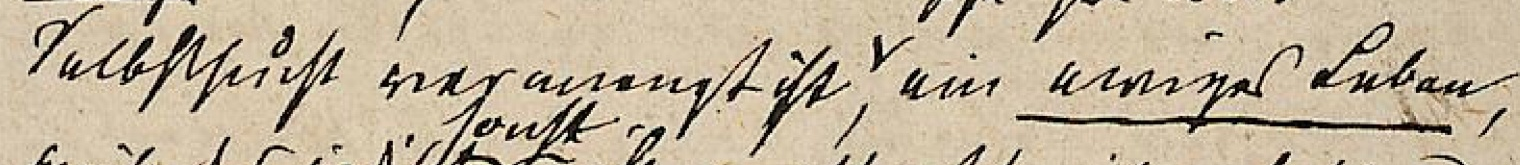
Selbstsucht vermengt ist, ein ewiges Leben,
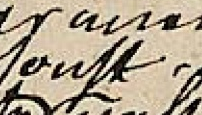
sonst
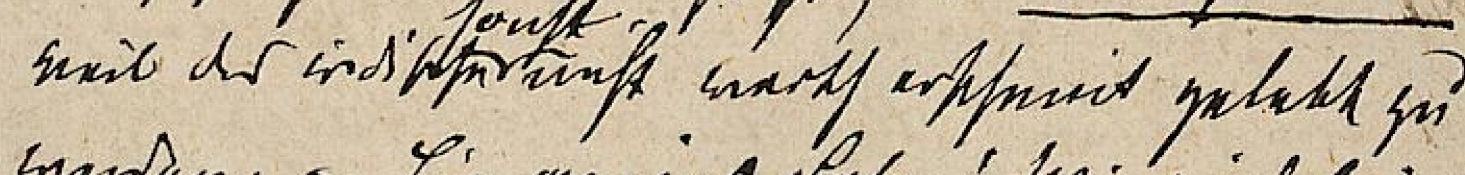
weil das irdische nichts werth erscheint gelebet zu
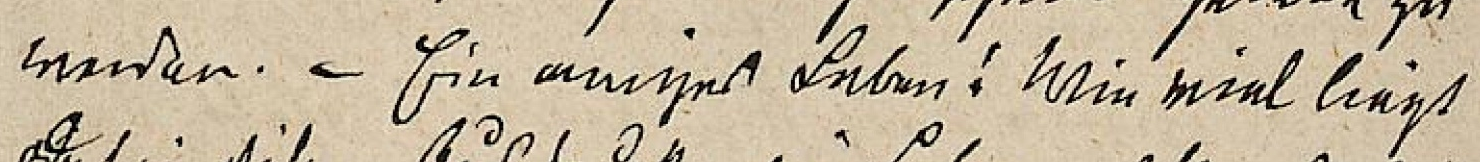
werden. _ Ein ewiges Leben! Wie viel liegt
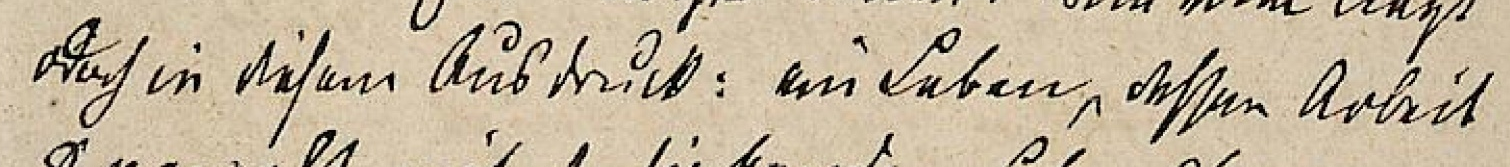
doch in diesem Ausdruck: ein Leben,. dessen Arbeit
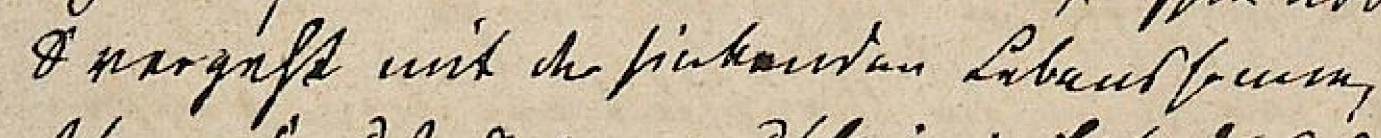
o vergeht mit dem sinkenden Lebenssamen
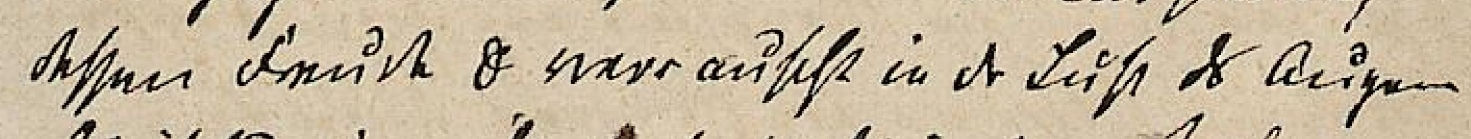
dessen Freude o verrauscht in dr Lust ds Augen¬
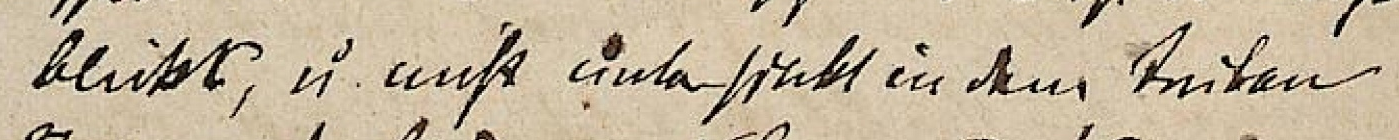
blicks, u nicht untersinkt in dem trüben
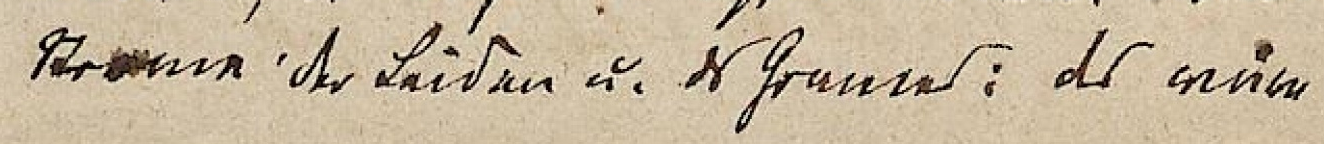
Strome der Leiden u. ds Grames: ds wäre
